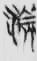漾
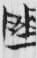陵
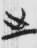之
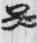厽（參）
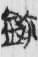鉨
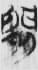○（間）
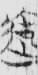御
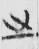之
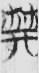典
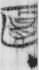匱
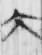大
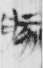痎
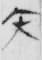內
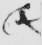氏
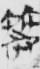等
